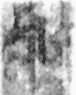○（雕）
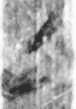勺
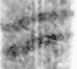二
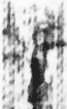才（在）
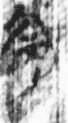長
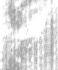{尾少}
